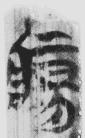瘍
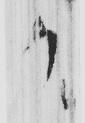人
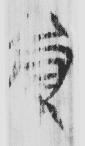賞
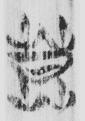莫
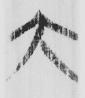大
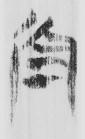於
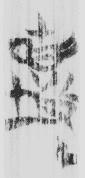壤
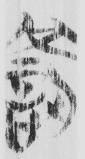罰
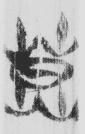莫
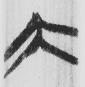大
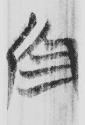於
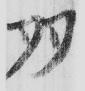多
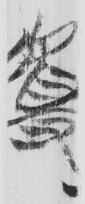虘B
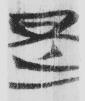是
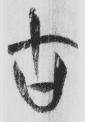古
